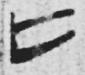亡（無）
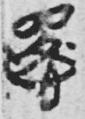○（隱）
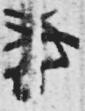志
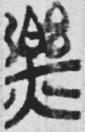樂
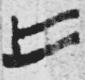亡（無）
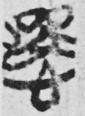○（隱）
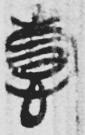情
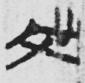吝（文）
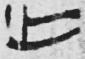亡（無）
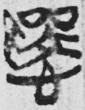○（隱）
